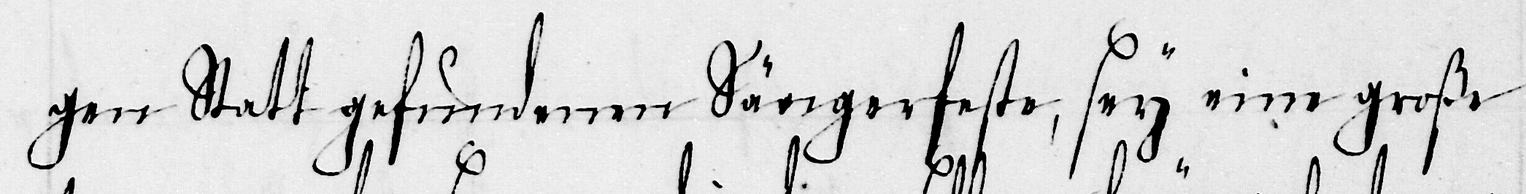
gen Statt gefundenen Sängerfeste, sey eine große
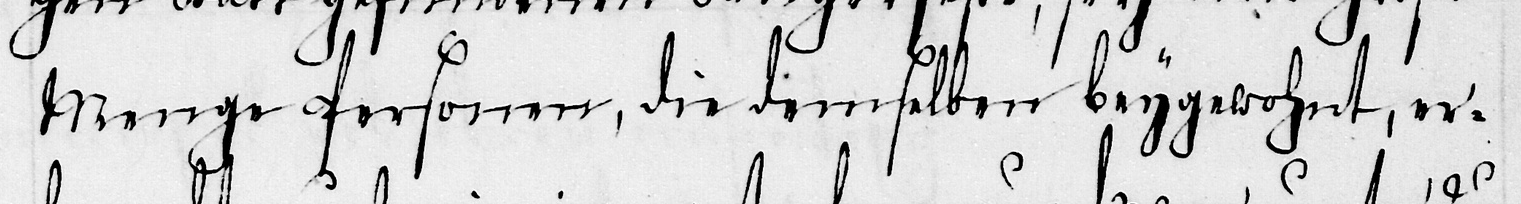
Menge Personen, die demselben beygewohnt, er¬
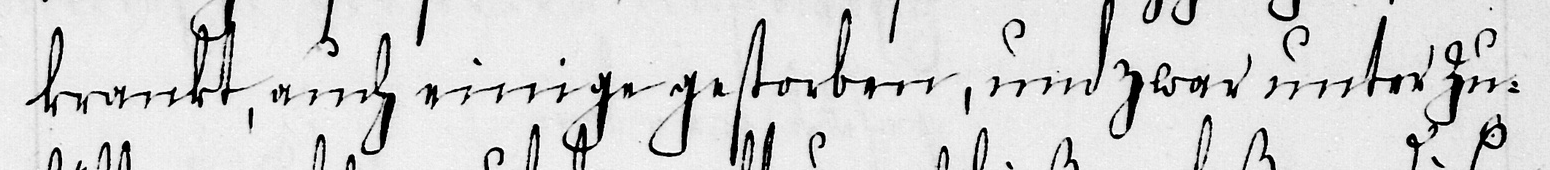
krankt, auch einige gestorben, und zwar unter Zu¬
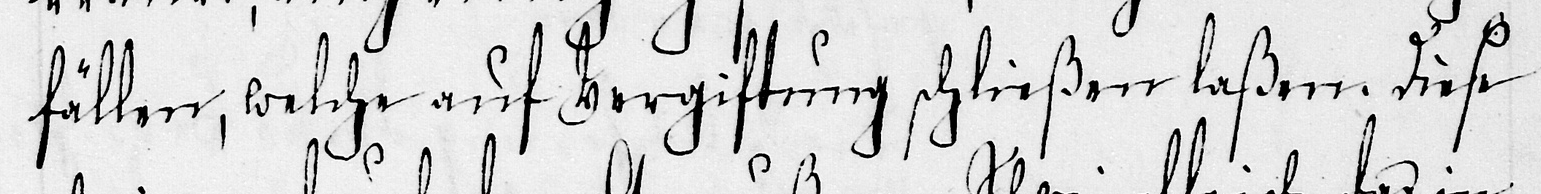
fällen, welche auf Vergiftung schließen laßen. Diese
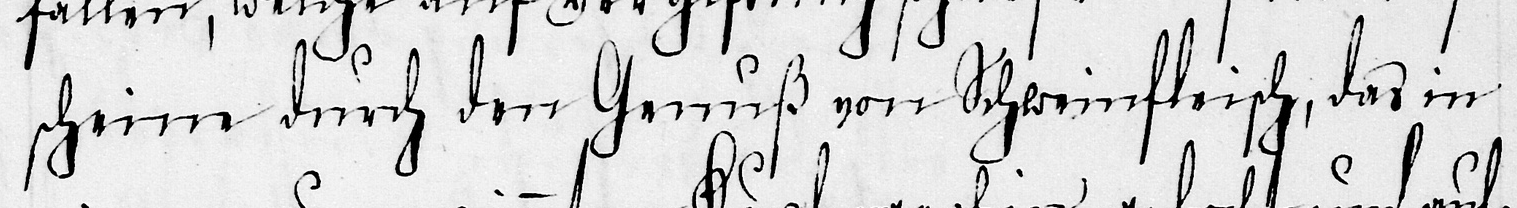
scheine durch den Genuß von Schweinfleisch, das in
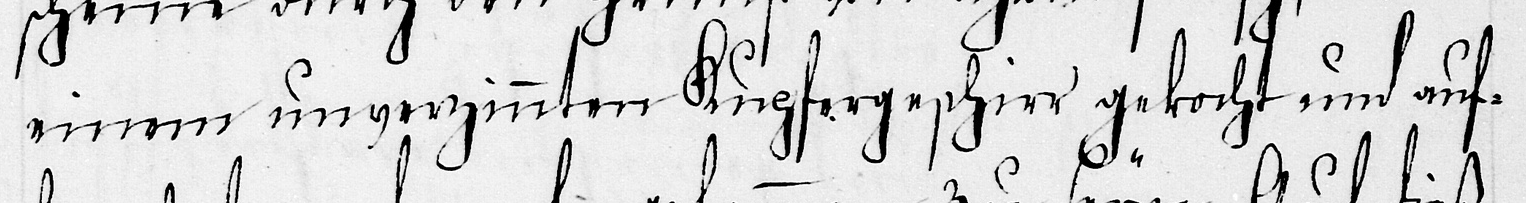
einem unverzinnten Kupfergeschirr gekocht und auf¬
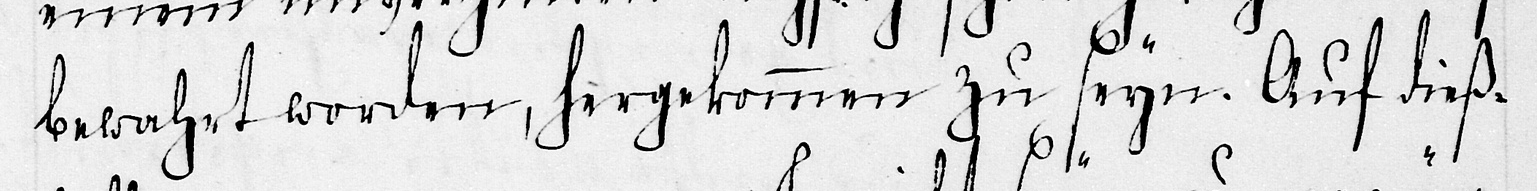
bewahrt worden, hergekommen zu seyn. Auf dieß¬
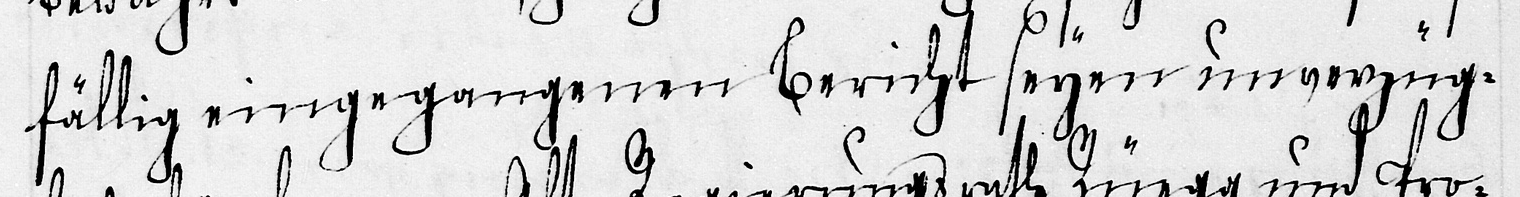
fällig eingegangenen Bericht seyen unverzüg¬
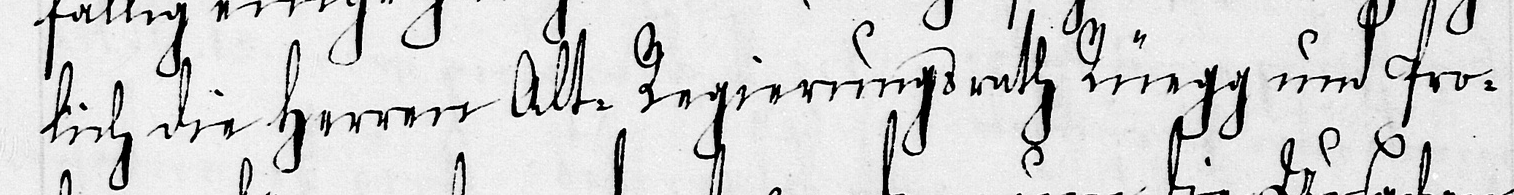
lich die Herren Alt-Regierungsrath Rüegg und Pro¬
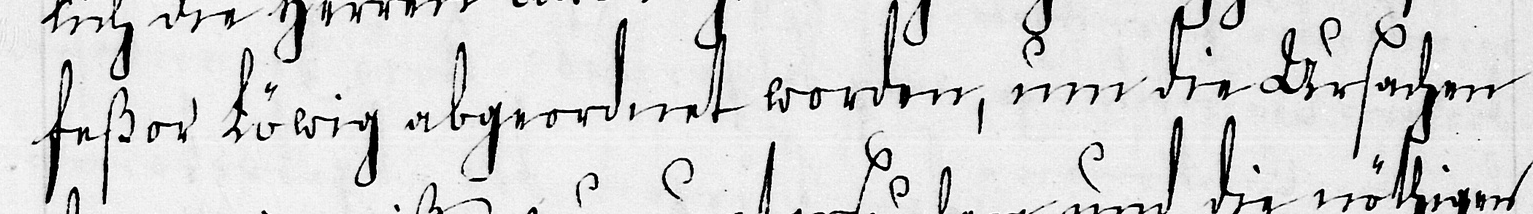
feßor Löwig abgeordnet worden, um die Ursachen
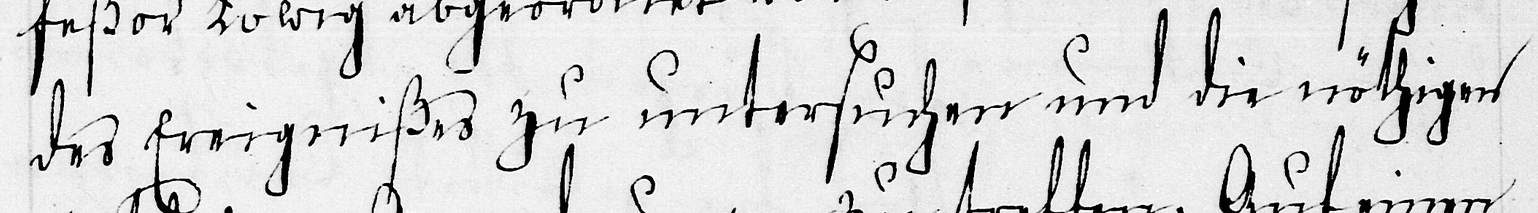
des Ereignißes zu untersuchen und die nöthigen
